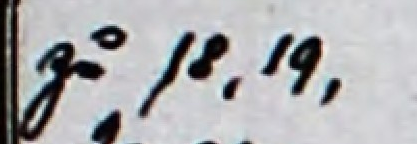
zu 18, 19,
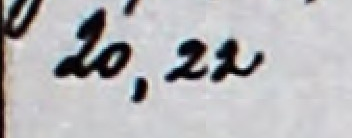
20, 22
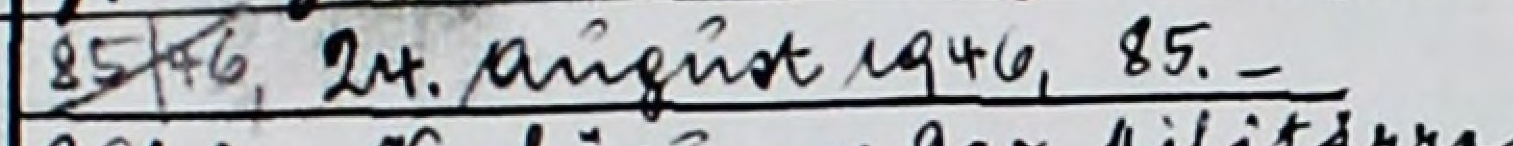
85/46, 24. August 1946, 85.-
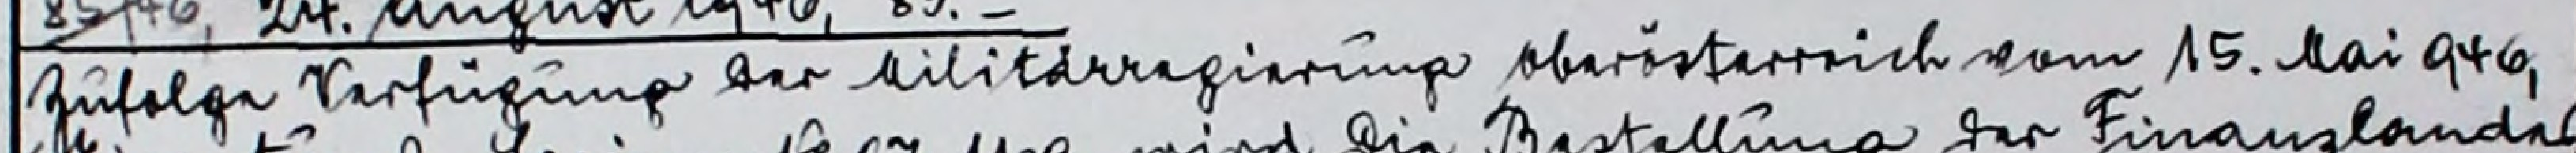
Zufolge Verfügung der Militärregierung Oberösterreich vom 15. Mai 946;
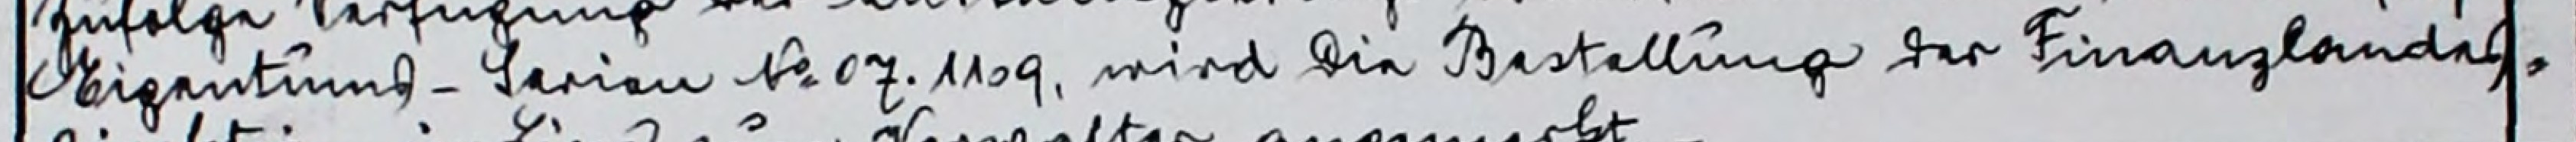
Eigentums - Serien No 07.1109, wird die Bestellung der Finanzlandes„
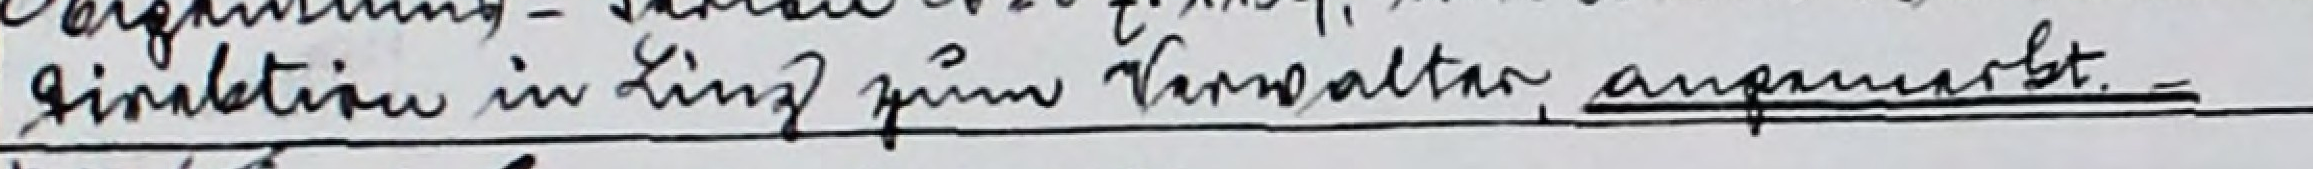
direktion in Linz zum Verwalter, angemerkt.
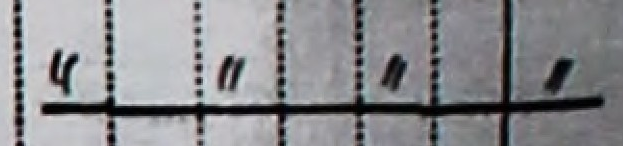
„ „ „ „
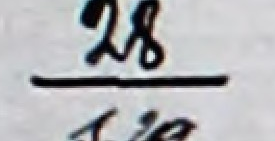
28
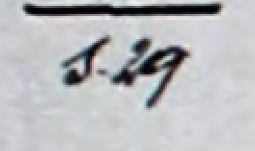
s. 29
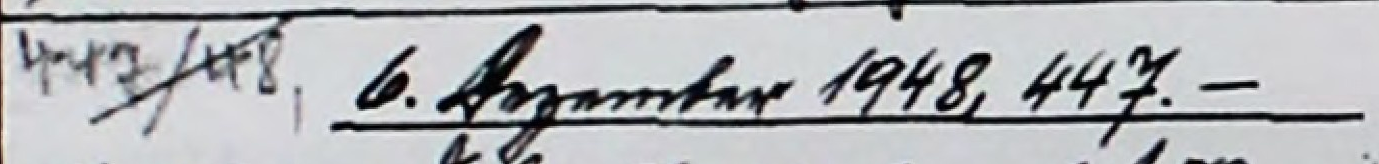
447/548, 6. Dezember 1948, 447.-
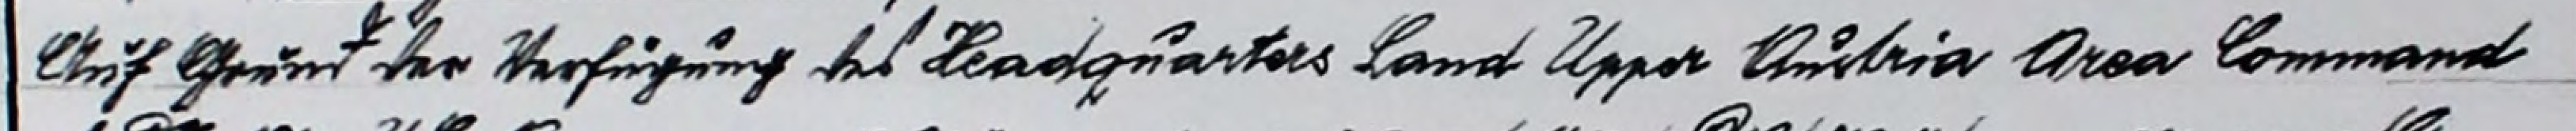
Auf Grund der Verfügung des Headquarters Land Upper Austria Area Command
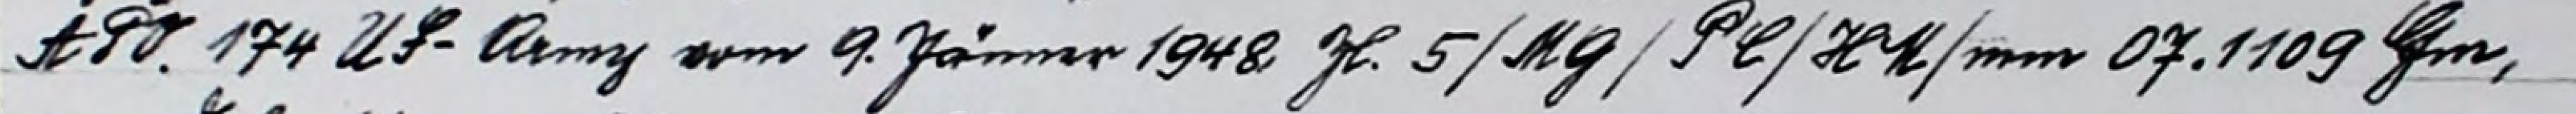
APO. 174 UF - Army vom 9. Jänner 1948, Zl. 5/MG/Pl.HM/mm 07.1109 Gm,
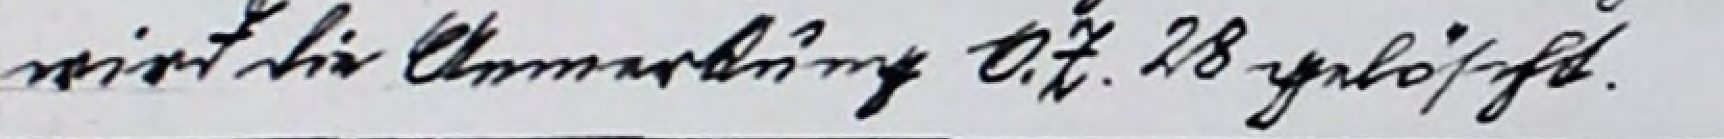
wird die Anmerkung O.Z. 28 gelöscht.
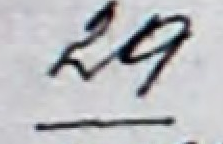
29
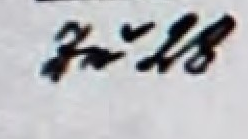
zu 28
